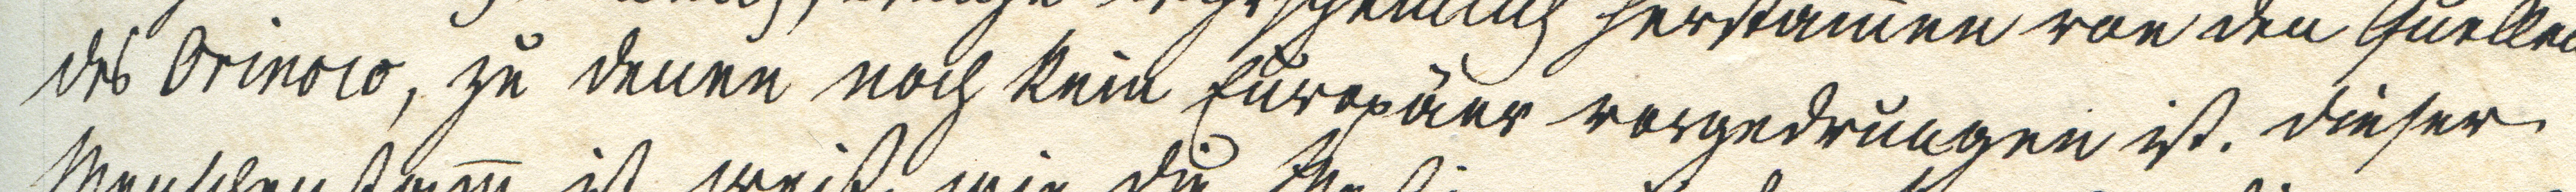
des Orinoco, zu denen noch kein Europäer vorgedrungen ist. Dieser
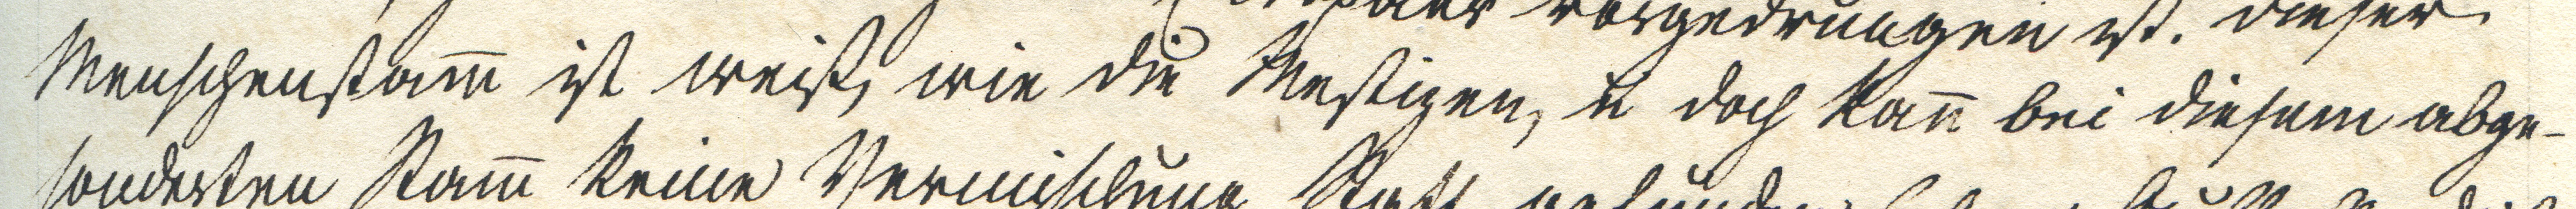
Menschenstam̃ ist weiß, wie die Mestizen, u doch kañ bei diesem abge-
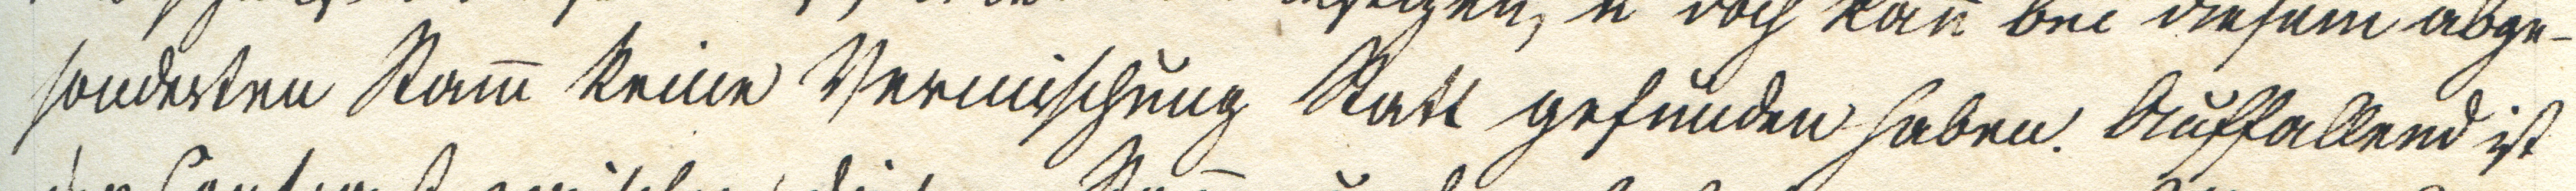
sonderten Stam̃ keine Vermischung Statt gefunden haben. Auffallend ist
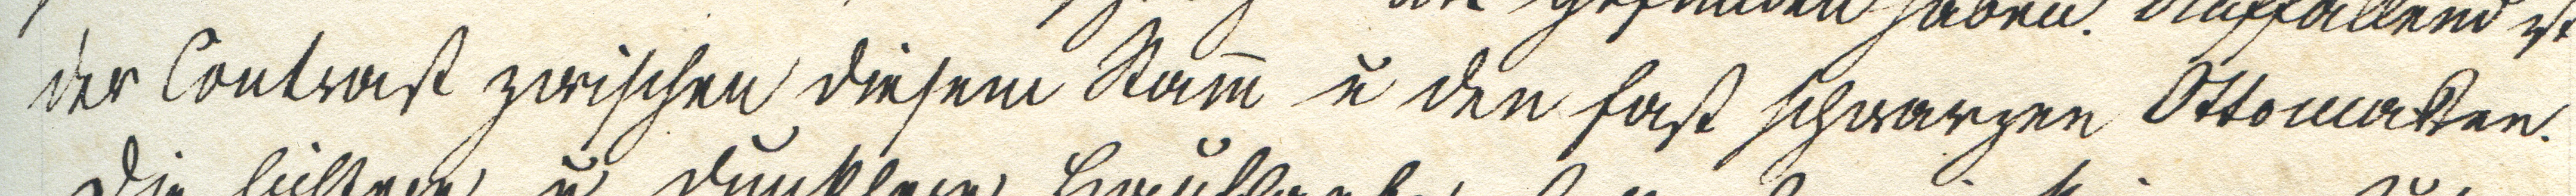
der Contrast zwischen diesem Stam̃ u den fast schwarzen Ottomaken.
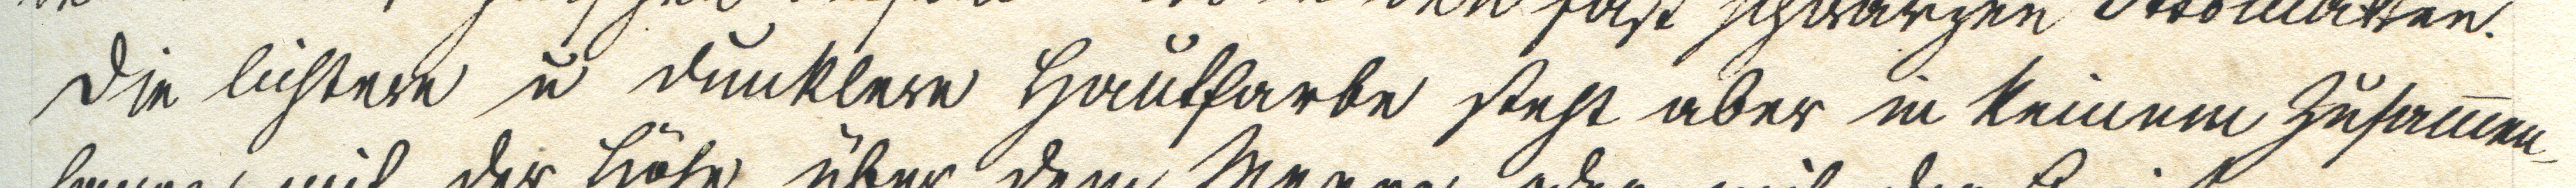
Die lichtere u dunklere Hautfarbe steht aber in keinem Zusam̃en-
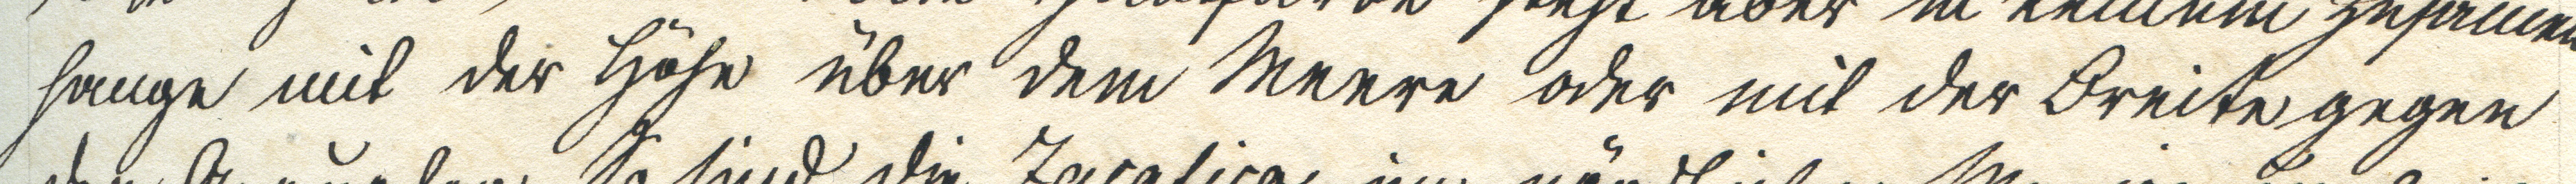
hange mit der Höhe über dem Meere oder mit der Breite gegen
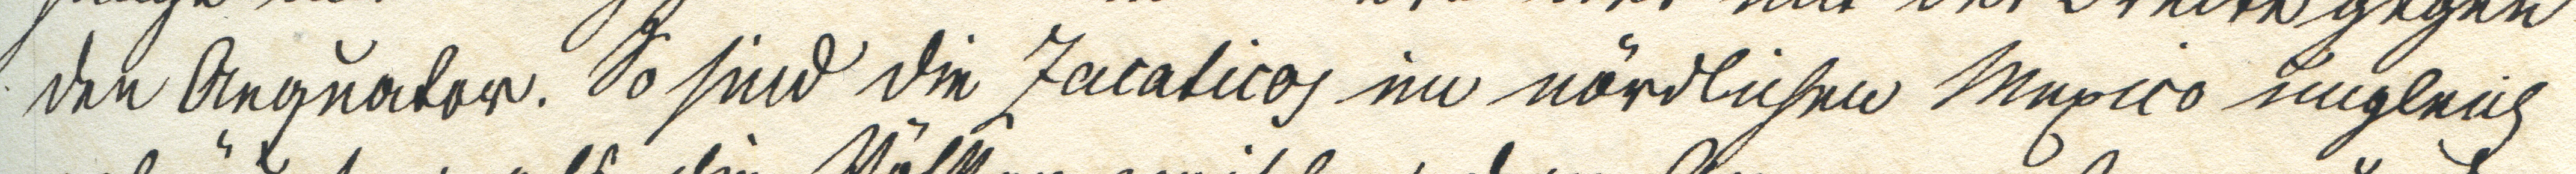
den Aequator. So sind die Zacaticos im nördlichen Mexico ungleich
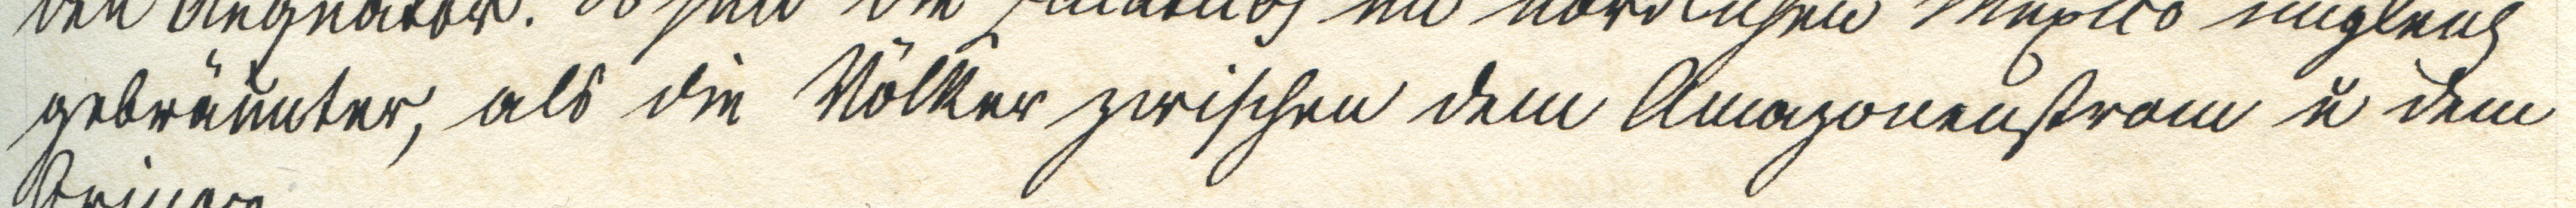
gebräunter, als die Völker zwischen dem Amazonenstrom u dem
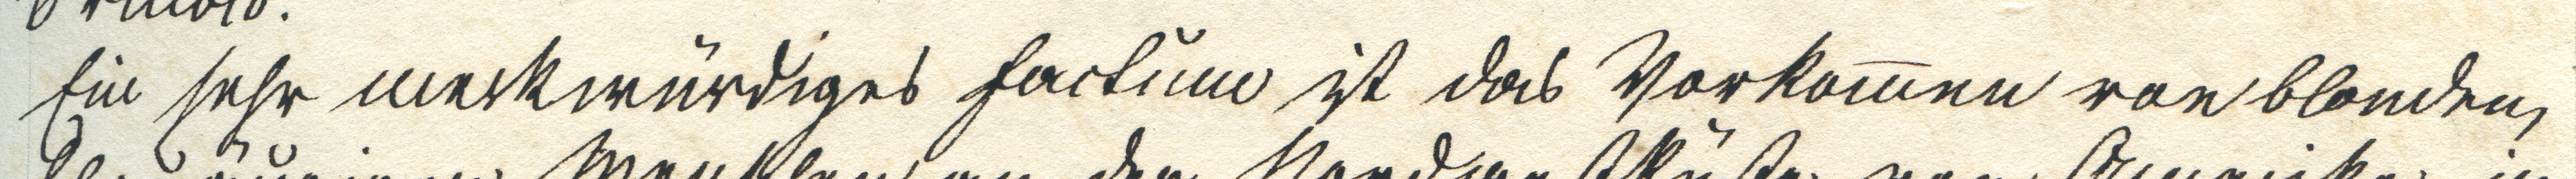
Ein sehr merkwürdiges Factum ist das Vorkom̃en von blonden,
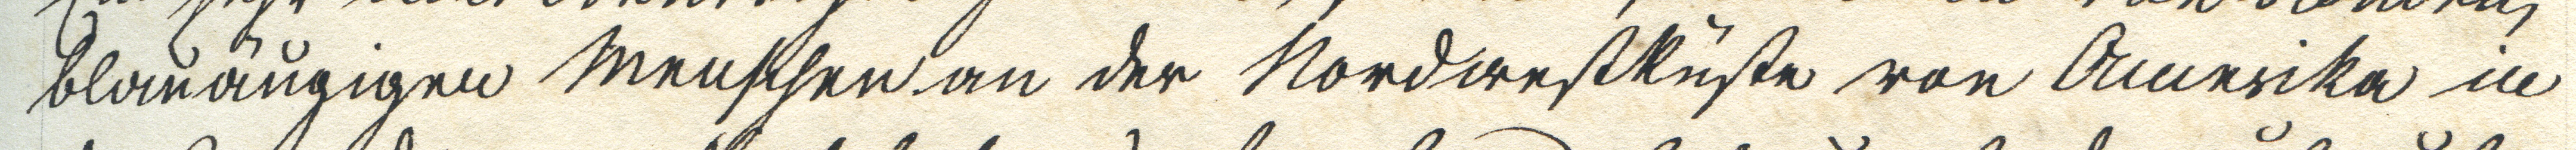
blauäugigen Menschen an der Nordwestküste von Amerika in
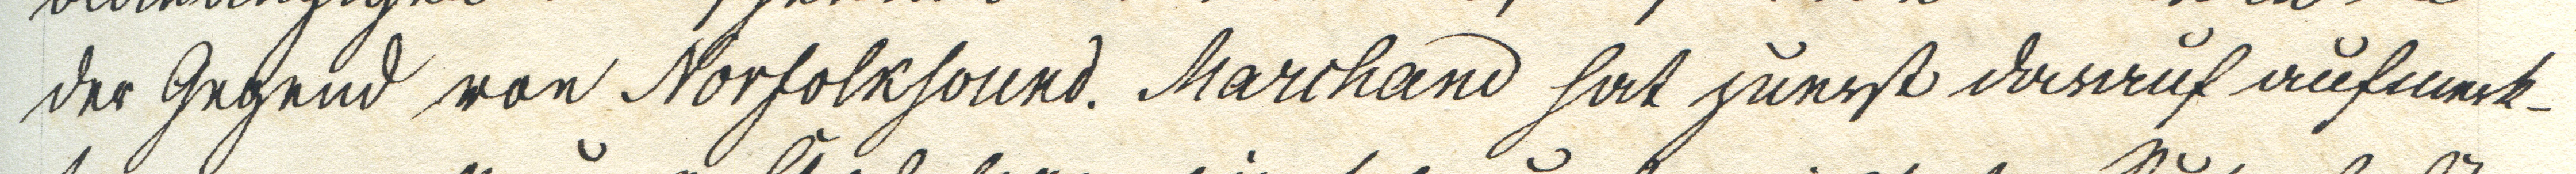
der Gegend von Norfolksound. Marchand hat zuerst darauf aufmerk-
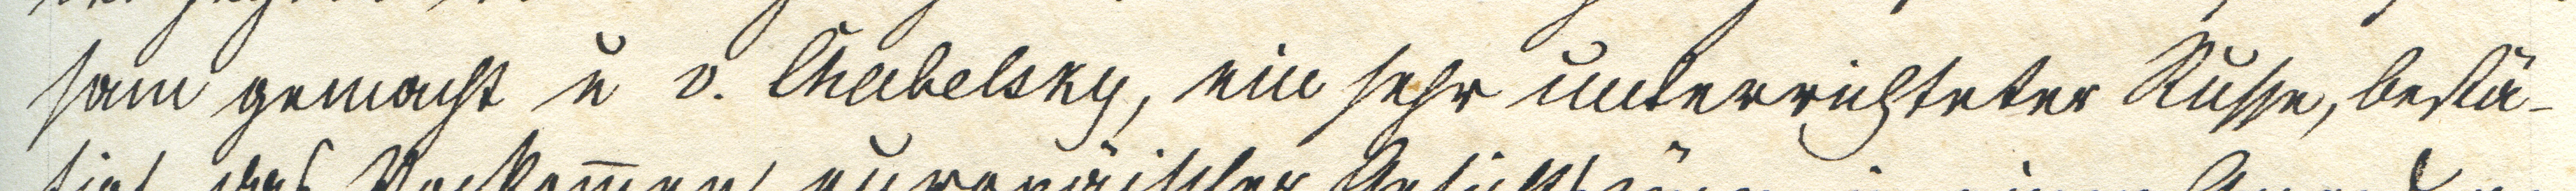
sam gemacht u v. Chabelsky, ein sehr unterrichteter Russe, bestä-
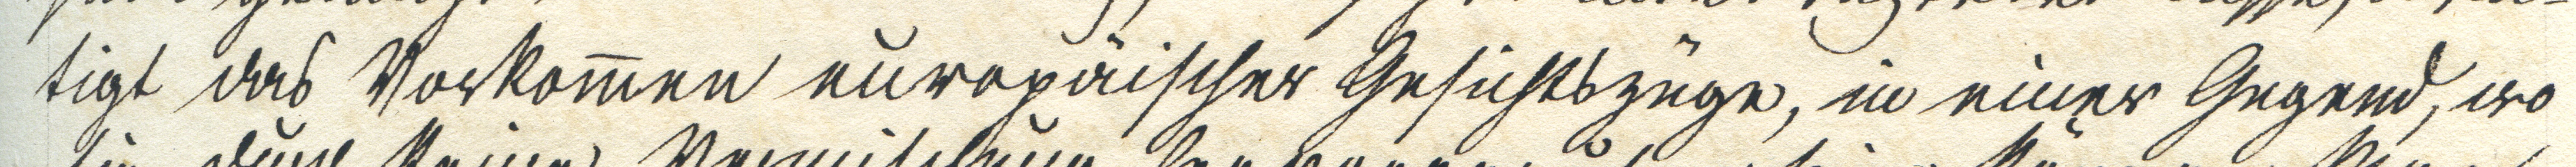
tigt das Vorkom̃en europäischer Gesichtszüge, in einer Gegend, wo
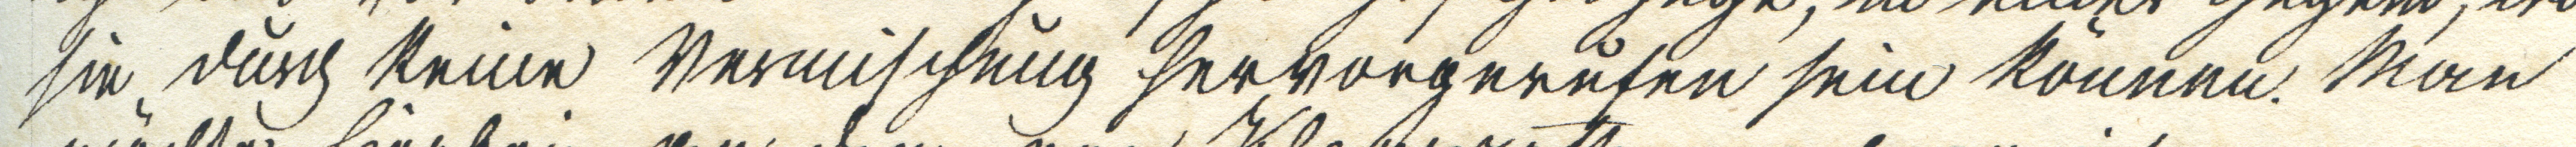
sie durch keine Vermischung hervorgerufen sein können. Man
